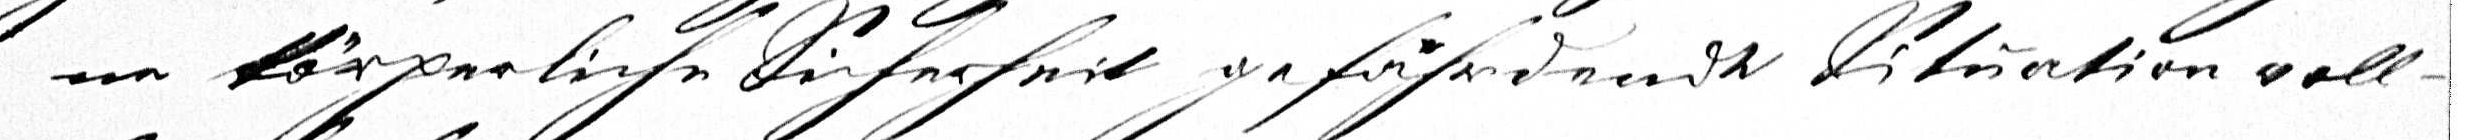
ne körperliche Sicherheit gefährdende Situation voll¬
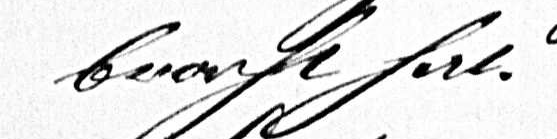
bracht hat.
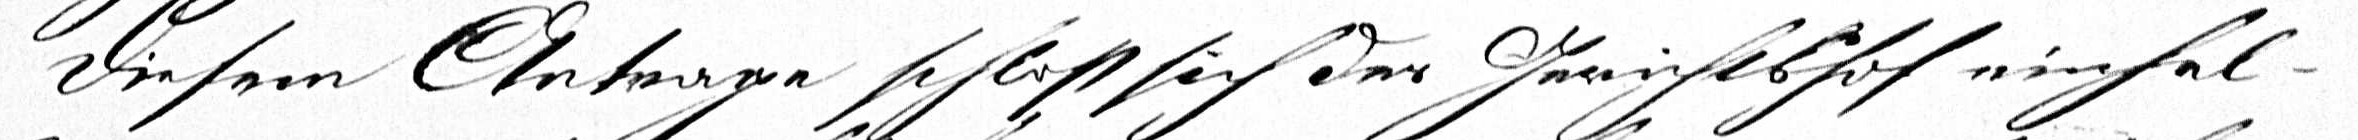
Diesem Antrage schloß sich der Gerichtshof einhel¬
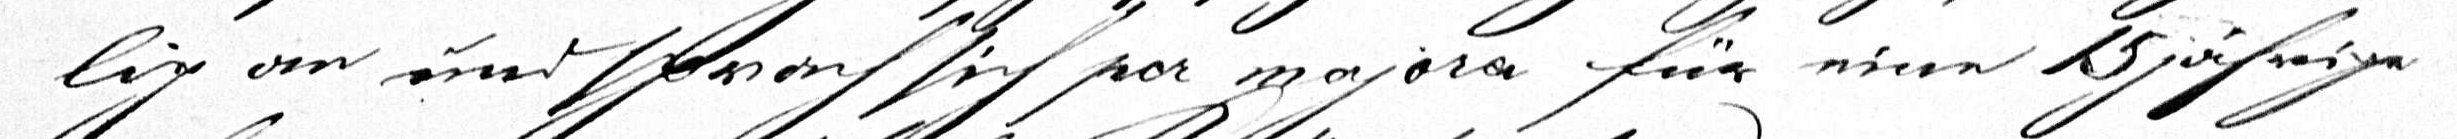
lig an und sprach sich por majora für eine 15jährige
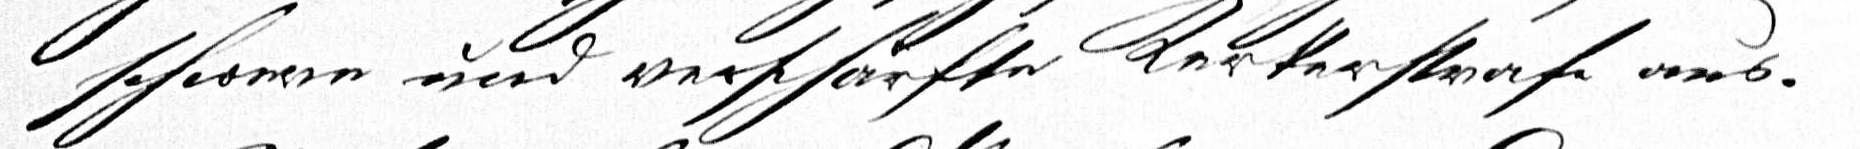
schwere und verschärfte Kerkerstrafe aus.
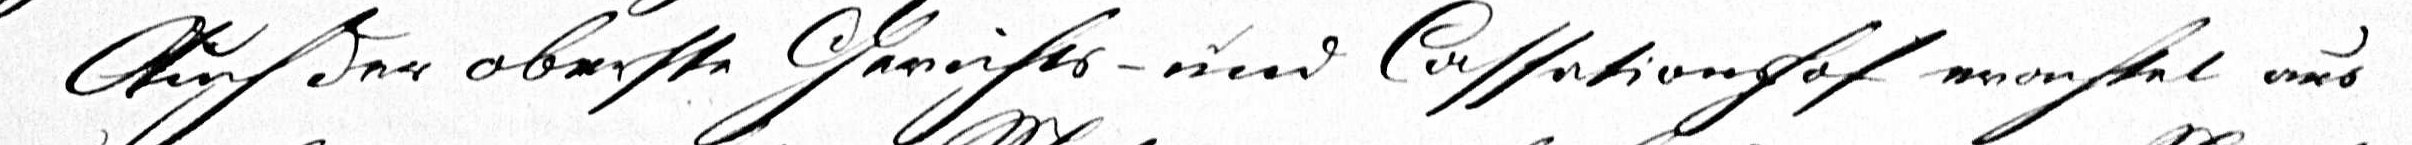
Auch der oberste Gerichts- und Cassationshof erachtet aus
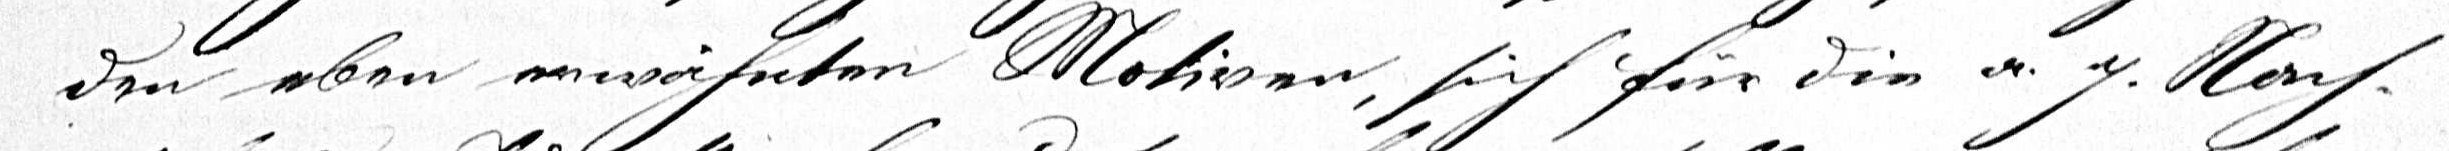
den eben erwähnten Motiven, sich für die a. g. Nach¬
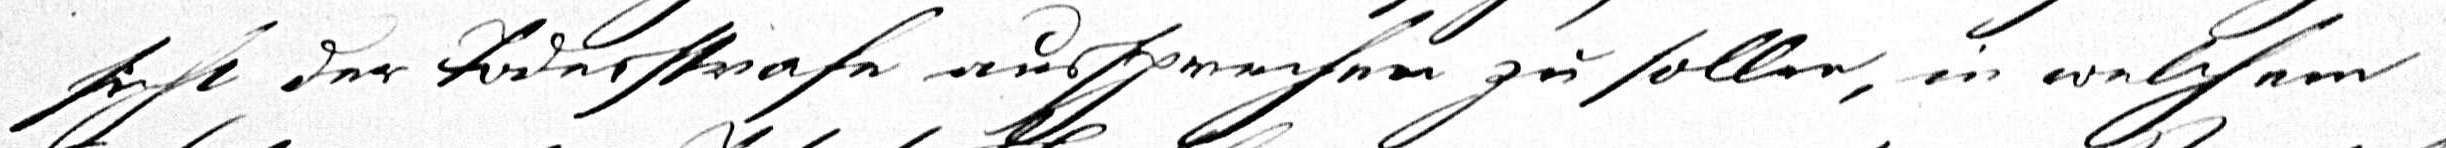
sicht der Todesstrafe aussprechen zu sollen, in welchem
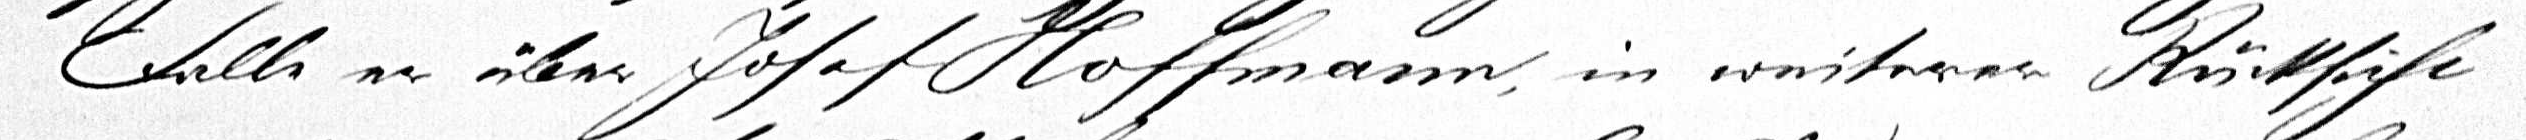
Falle er über Josef Hoffmann, in weiterer Rücksicht
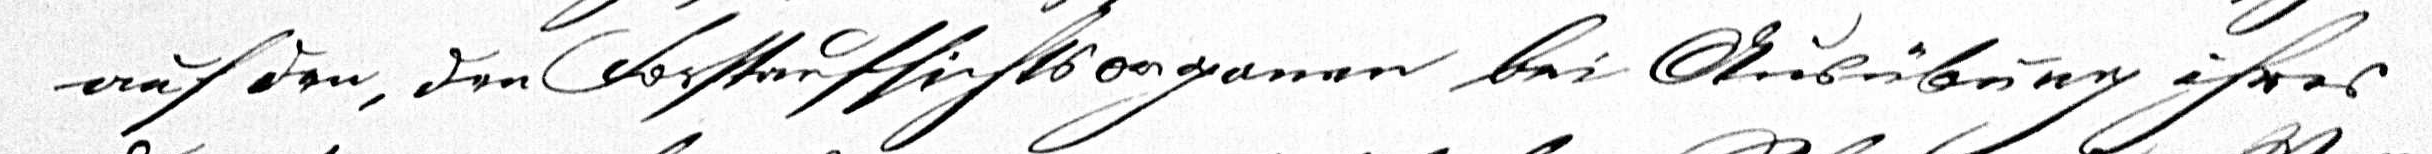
auf den, den Bestaufsichtsorganen bei Ausübung ihres
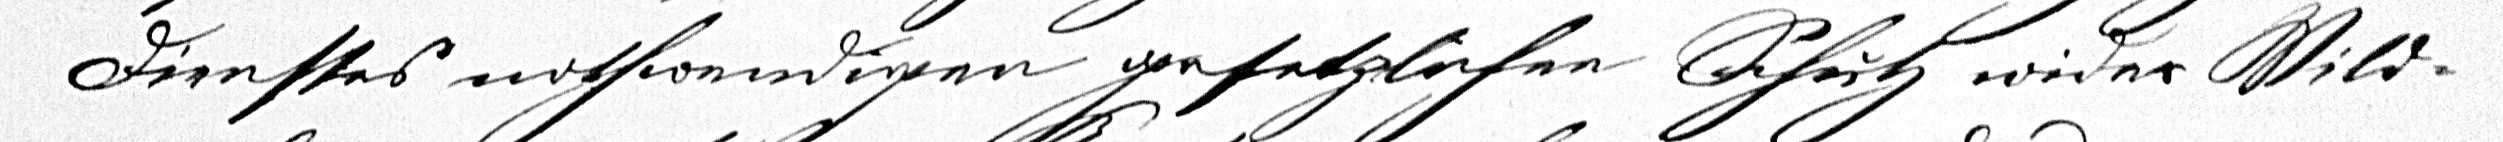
Dienstes nothwendigen gesetzlichen Schutz wider Wild¬
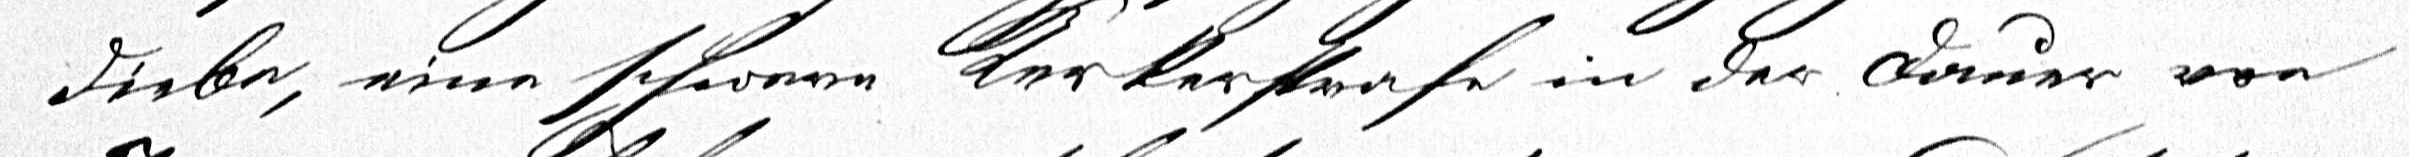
diebe, eine schwere Kerkerstrafe in der Dauer von
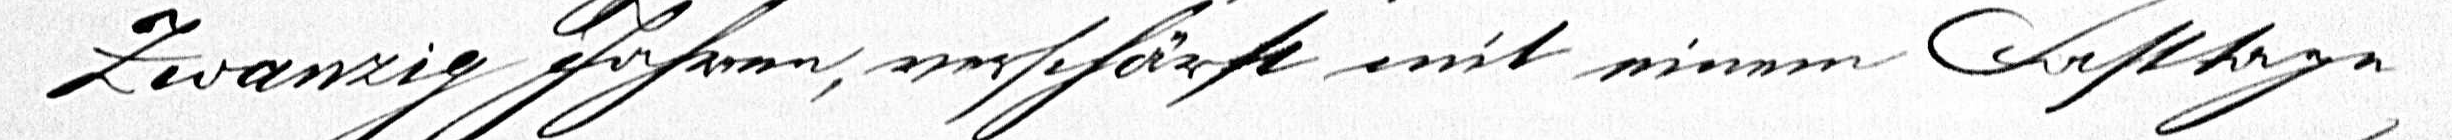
Zwanzig Jahren, verschärft mit einem Fasttage
